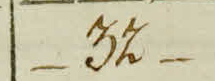- 32 -
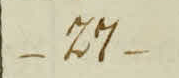- 27 -
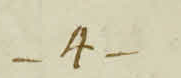- 4 -
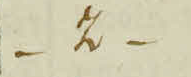- 2 -
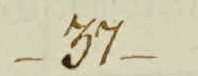- 37 -
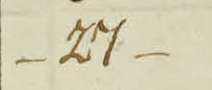- 27 -
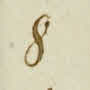8
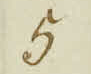5
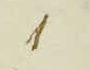1
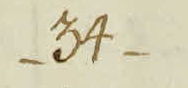- 34 -
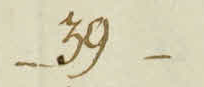- 39 -
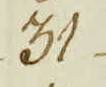31
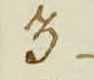3
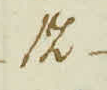12
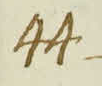44
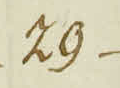29
